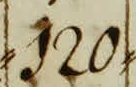120
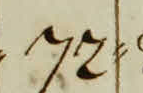72
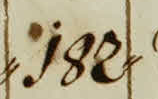182
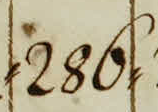286
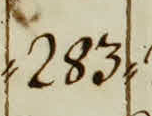283
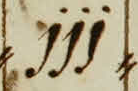111
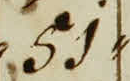51
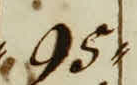95
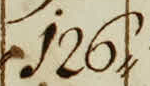126
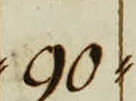90
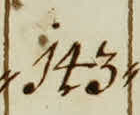143
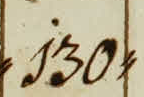130
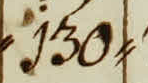130
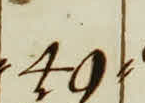49
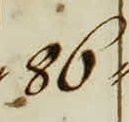86
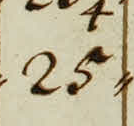25
